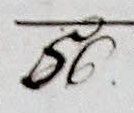56
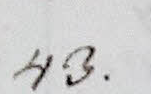43.
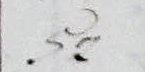52
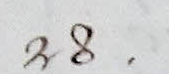28.
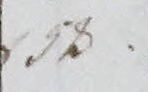58
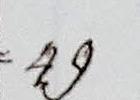49
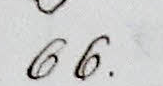66.
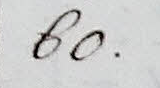60.
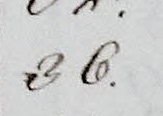36.
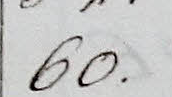60.
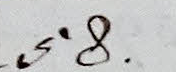58.
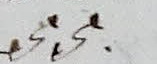55.
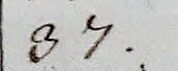37.
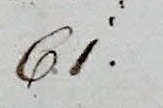61.
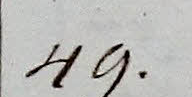49.
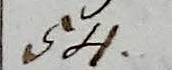54.
